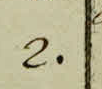2.
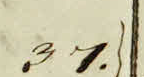37.
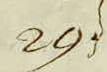29
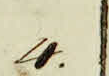4.
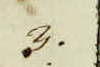3.
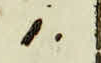1.
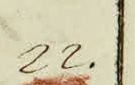22.
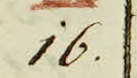16.
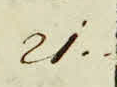21.
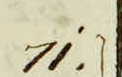71.
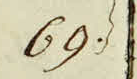69.
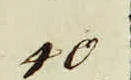40
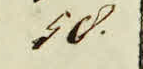58.
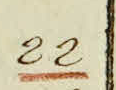22
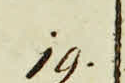19.
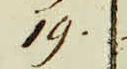19.
